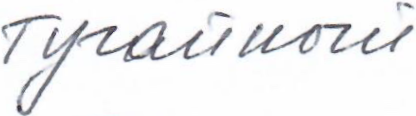тугайный
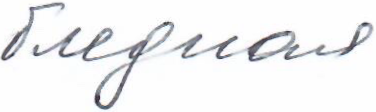бледная
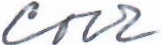сыч
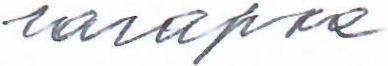гагарка
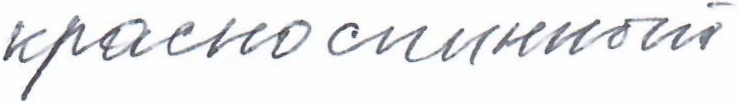красно спинный
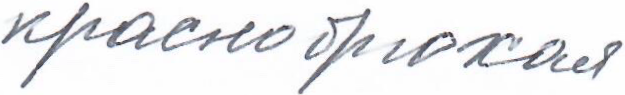краснобрюхая
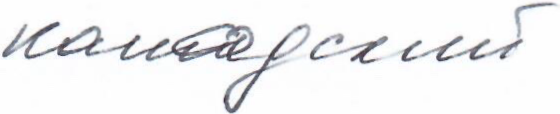канадский
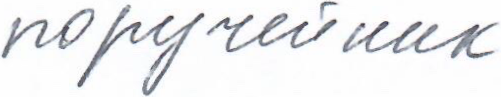поручейник
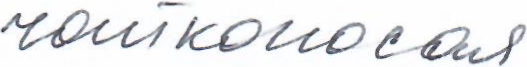чайконосая
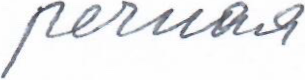речная
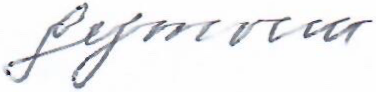дутыш
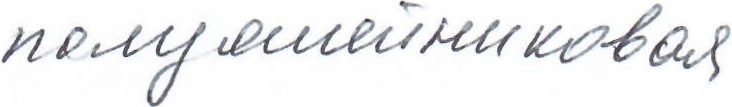полуошейниковая
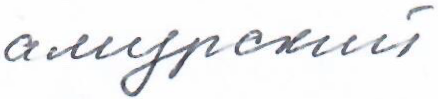амурский
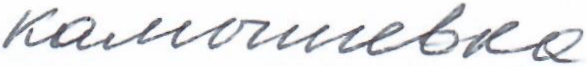камышевка
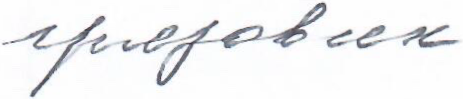грязовик
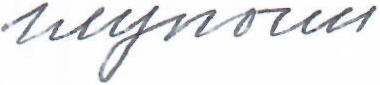глупыш
